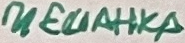плешанка
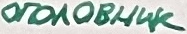ополовник
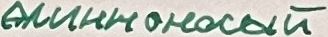длинноносый
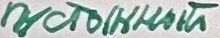пустынный
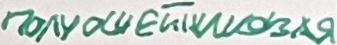полуошейниковая
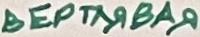вертлявая
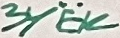зуёк
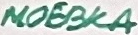моевка
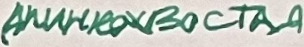длиннохвостая
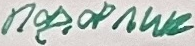подорлик
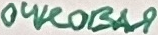очковая
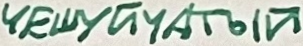чешуйчатый
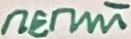пегий
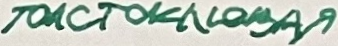толстоклювая
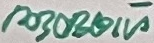розовый
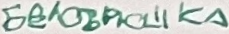белобрюшка
